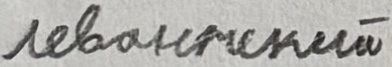левантский
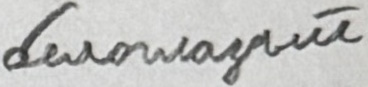белоглазый
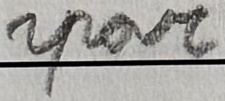грач
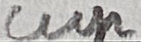сип
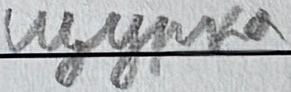щурка
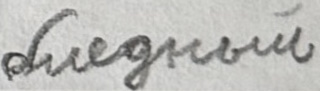бледный
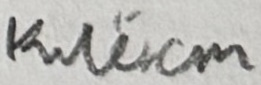клёст
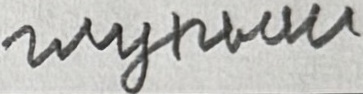глупыш
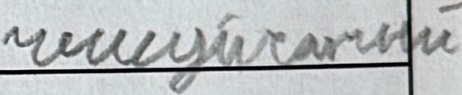чешуйчатый
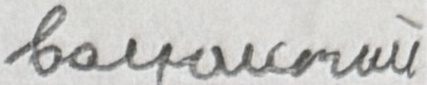волнистый
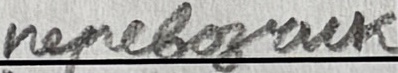перевозчик
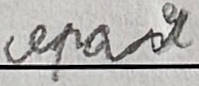серая
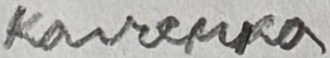каченка
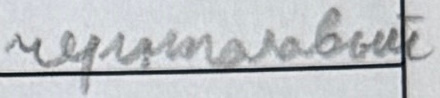чернполовый
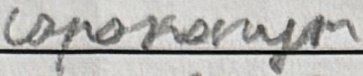сорокопут
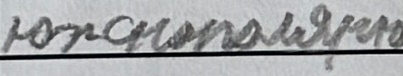южнополярн
